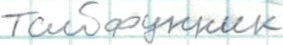тайфунник
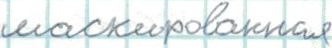маскированная
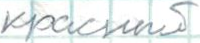красный
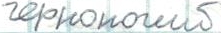черноногий
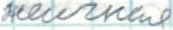желчная
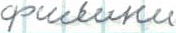филинн
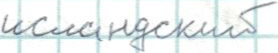исландский
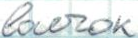волчок
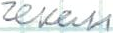чекан
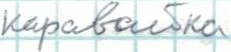каравайка
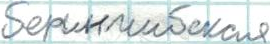берингийская
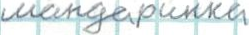мандаринка
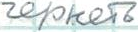чернеть
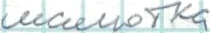малютка
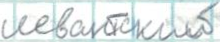левантский
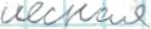лесная
